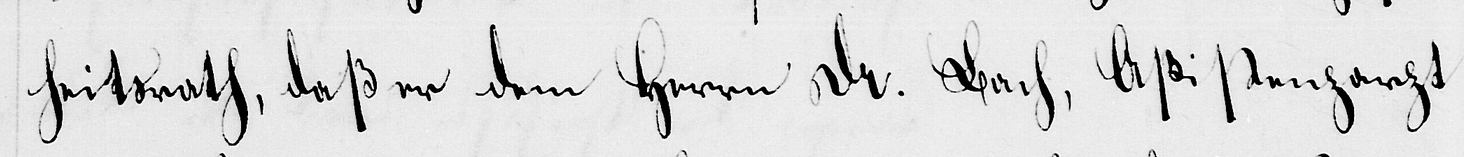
heitsrath, daß er dem Herrn Dr. Bach, Aßistenzarzt
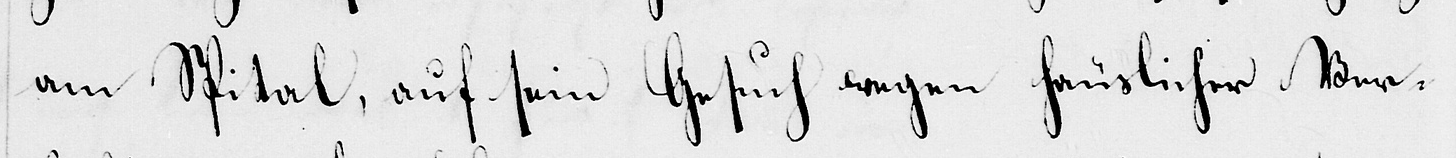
am Spital, auf sein Gesuch wegen häuslicher Ver¬
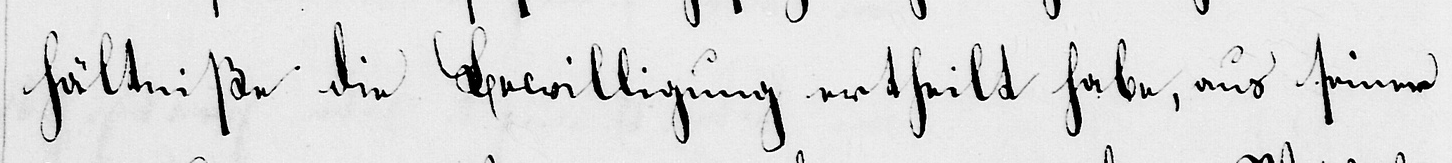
hältniße die Bewilligung ertheilt habe, aus seiner
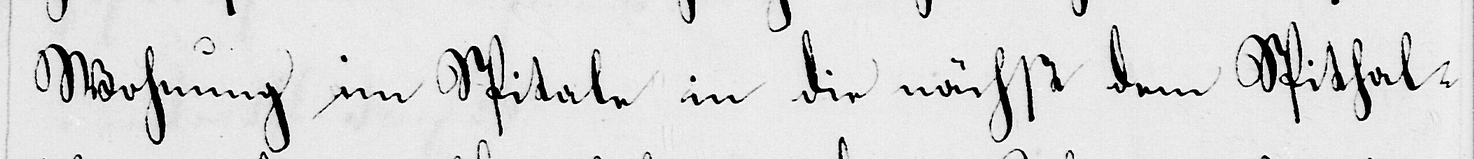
Wohnung im Spitale in die nächst dem Spithal¬
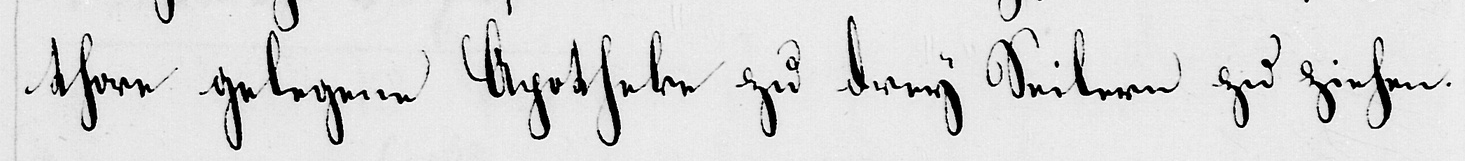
thore gelegene Apotheke zu drey Seilern zu ziehen.
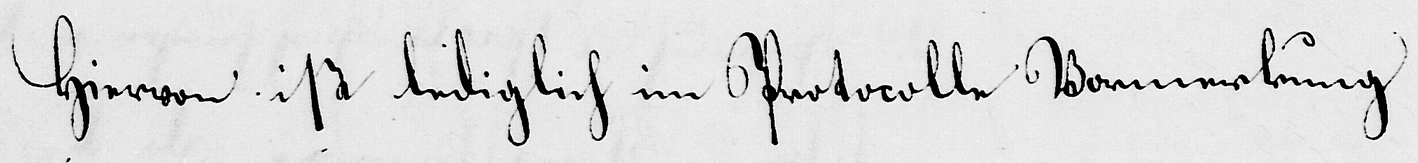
Hiervon ist lediglich im Protocolle Vormerkung
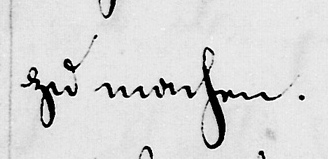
zu machen.
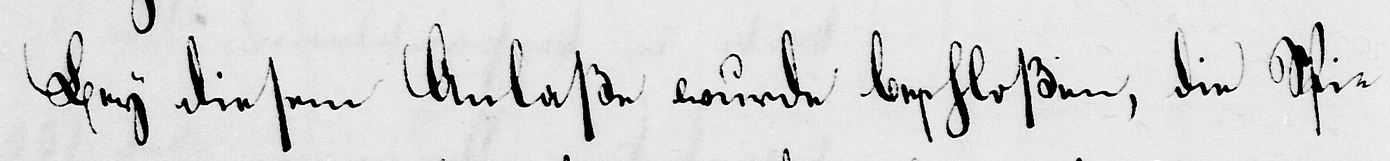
Bey diesem Anlaße wurde beschloßen, die Spi¬
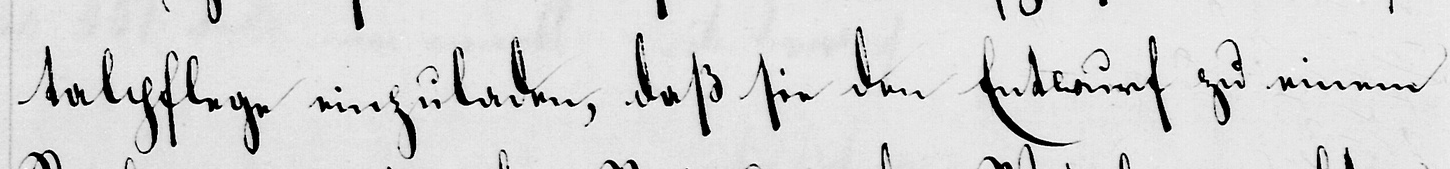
talpflege einzuladen, daß sie den Entwurf zu einem
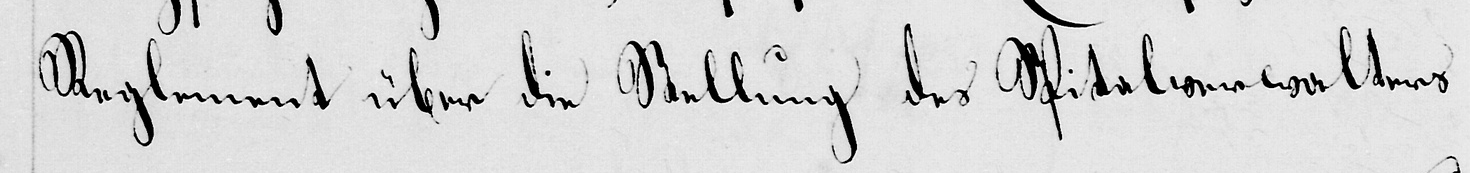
Reglement über die Stellung des Spitalverwalters
